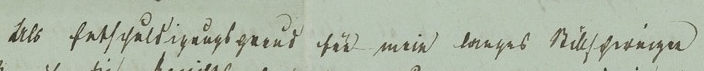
Als Entschuldigungsgrund für mein langes Stillschweigen
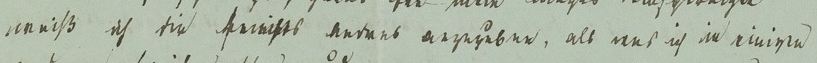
weiß ich dir nichts andres anzugeben, als was ich in einigen
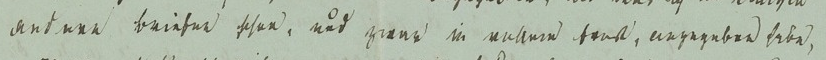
andren Briefen schon, und zwar in vollem Ernst, angegeben habe,
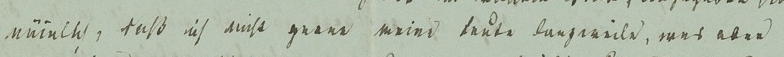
nämmlich, daß ich nicht gerne meine Leute langeweile, was aber
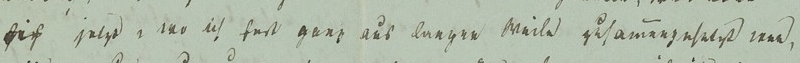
bis jetzt, wo ich fast ganz aus langer Weile zusammengesetzt war,
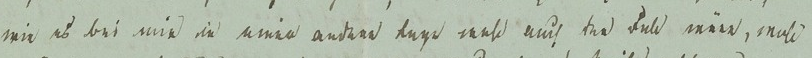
wie es bei mir in einer andren Lage wohl auch der Fall wäre, wohl
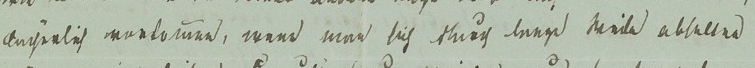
ärgerlich vorkommen, wenn man sich durch lange Weile abhalten
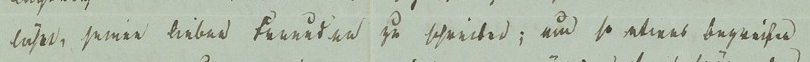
läßt, seinen lieben Freunden zu schreiben; um so etwas begreifen
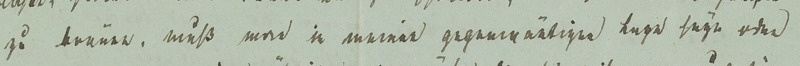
zu können, muß man in meiner gegenwärtigen Lage seyn oder
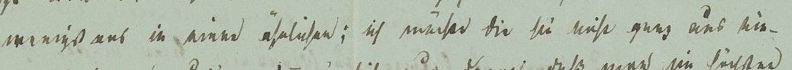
wenigstens in einer ähnlichen; ich möchte dir sie nicht ganz aus ein-
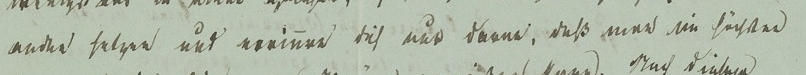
ander setzen und errinnre dich nur daran, daß man in höchstem
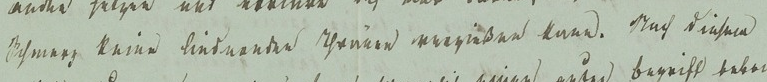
Schmerz keine lindernden Thränen vergießen kann. Nach diesem
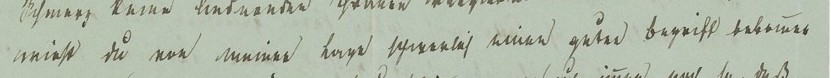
wirst du von meiner Lage schwerlich einen guten Begriff bekommen
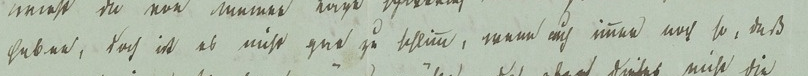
haben, doch ist es nicht gar zu schlimm, wenn auch immer noch so, daß
